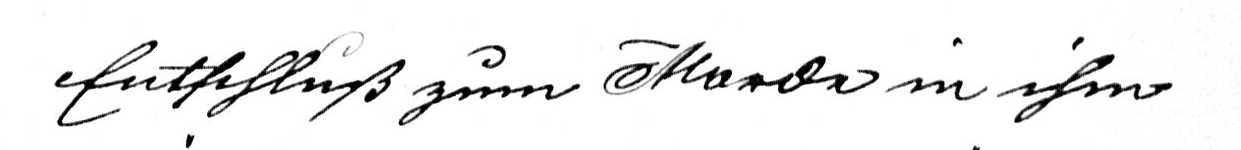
Entschluß zum Morde in ihm
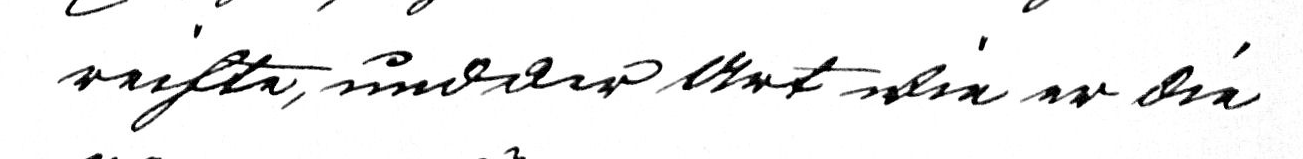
reihte, und der Art wie er die
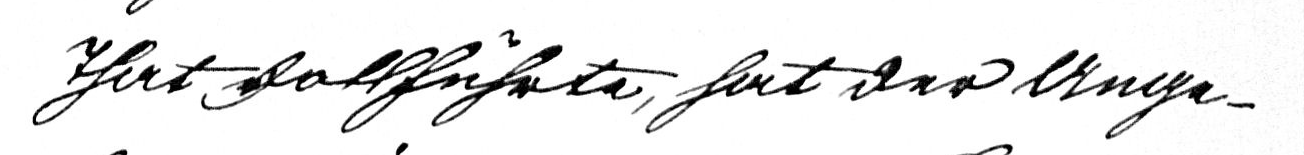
That vottführte, hat der Ange¬
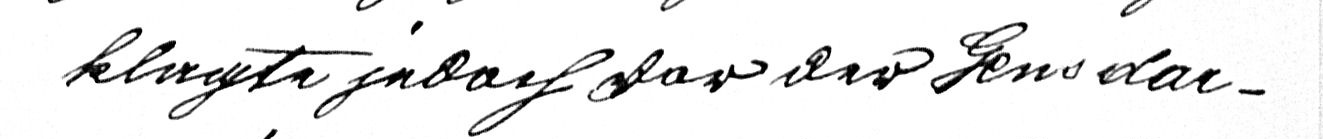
klagte jedoch vor der Gens dar¬
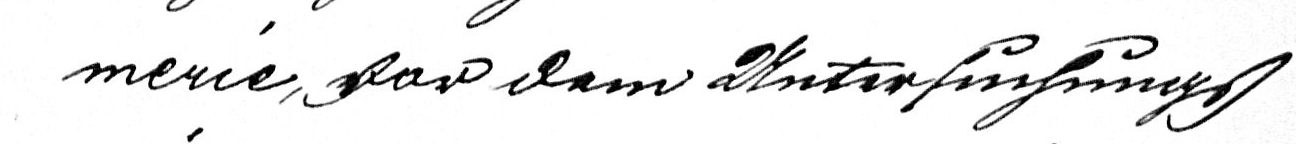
merie, vor dem Untersuchung
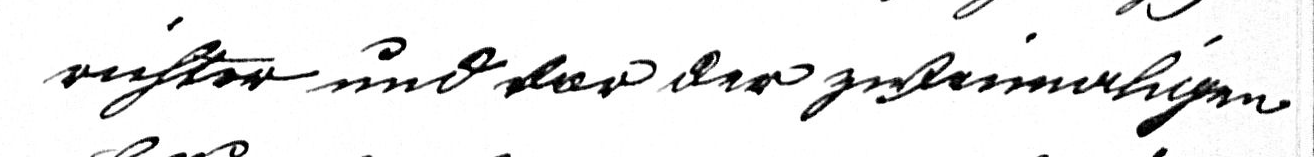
richter und vor der zweimaligen
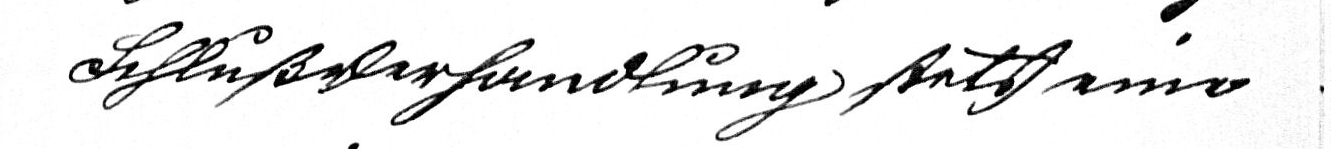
Schlußverhandlung stets eine
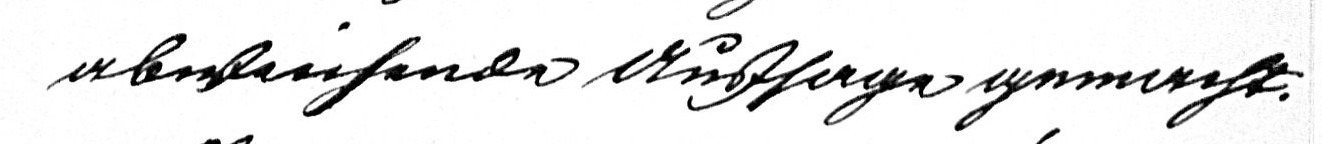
abweisende Aussage gemacht.
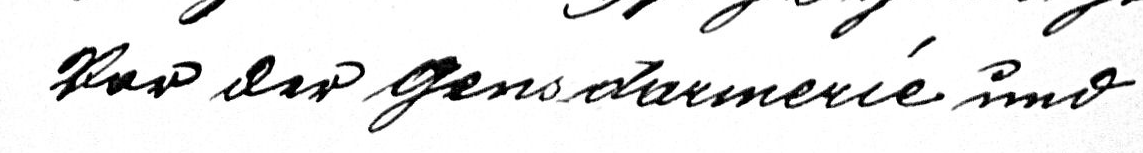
Vor der Gens darmercé und
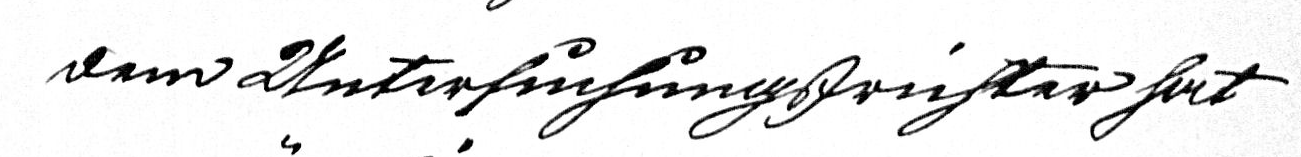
dem Untersuchungsrichter hat
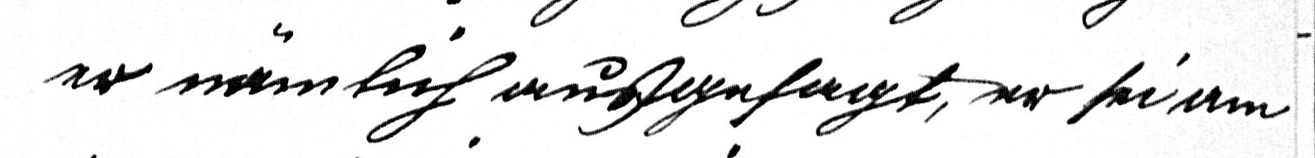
er nämlich ausgesagt, er sei am
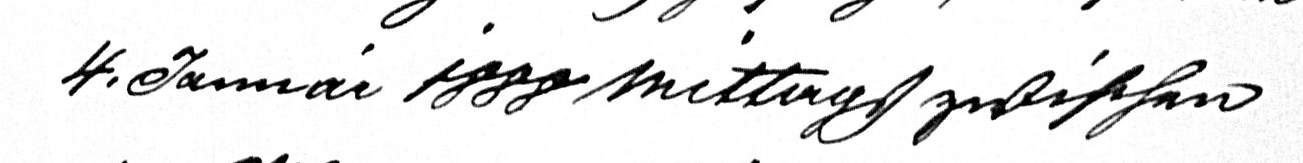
4. Január 1888 Mittags zwischen
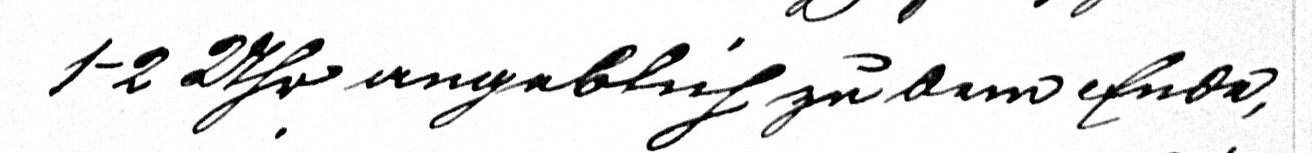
1 - 2 Uhr angeblich zu dem Ende,
